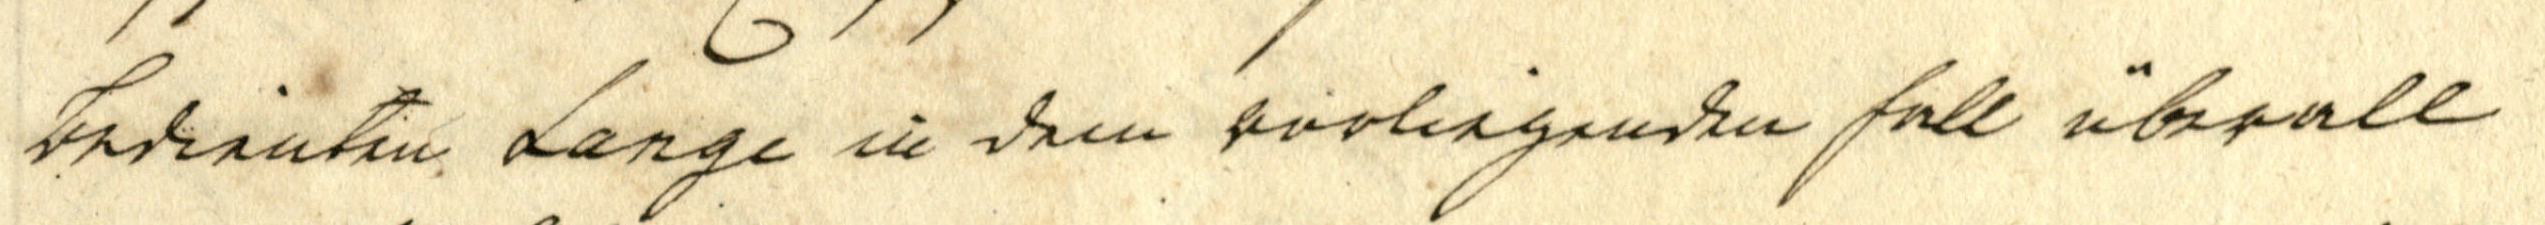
Bedienten Lange in dem vorliegenden fall überall
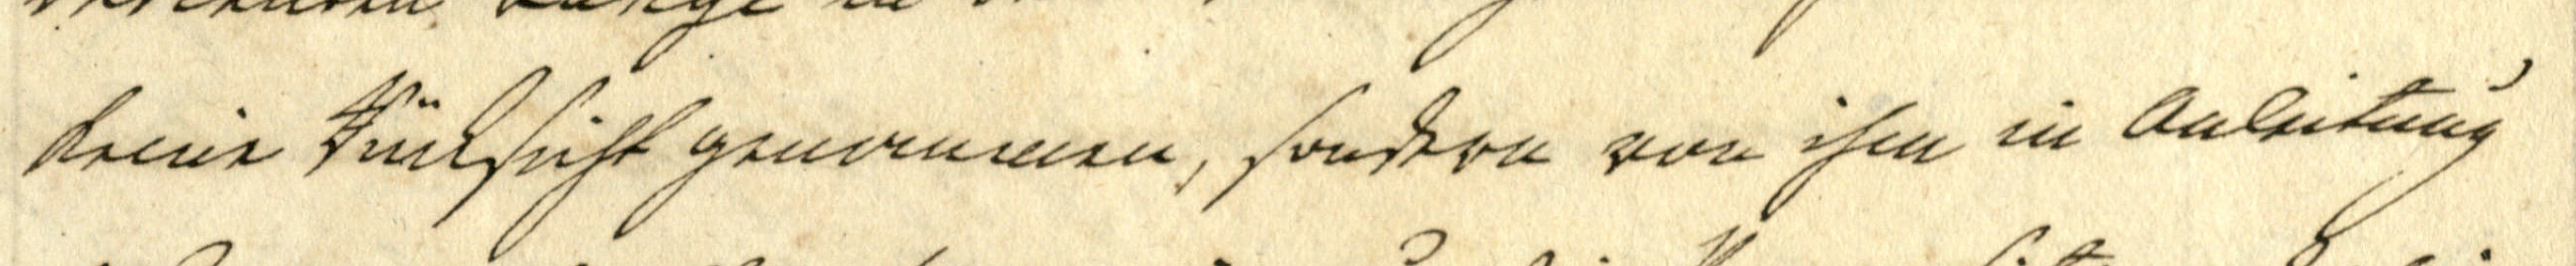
keine Rücksicht genommen, sondern von ihm in Anleitung
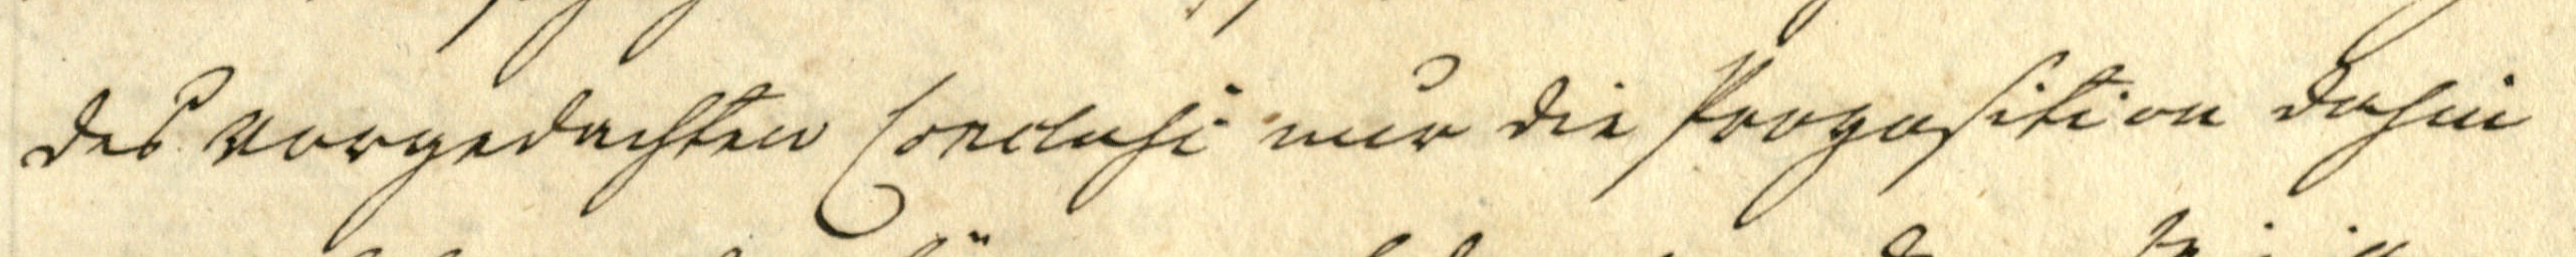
des vorgedachten Conclusi nur die Proposition dahin
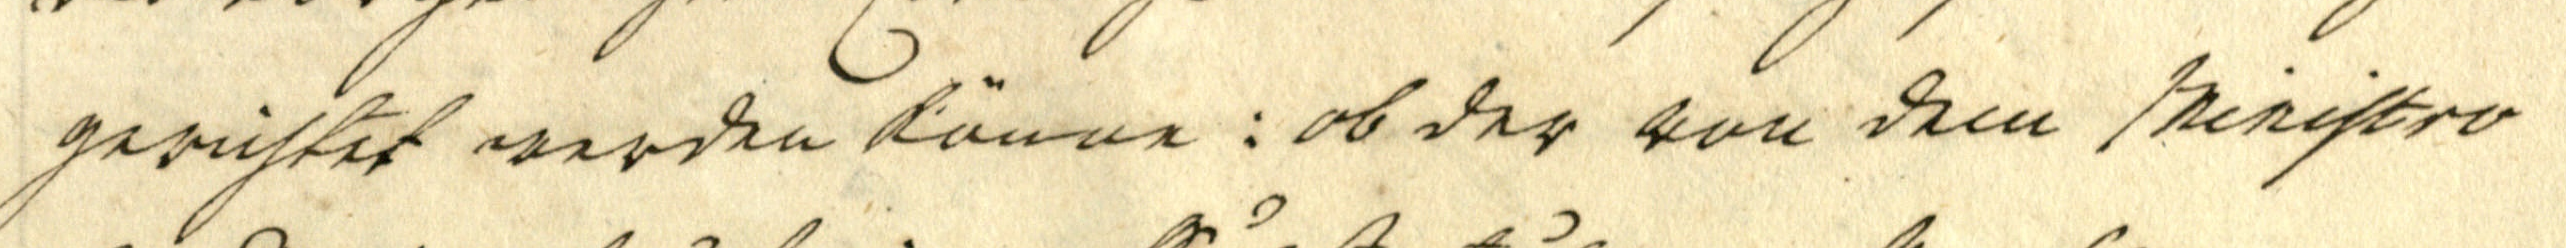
gerichtet werden könne: ob der von dem Ministro
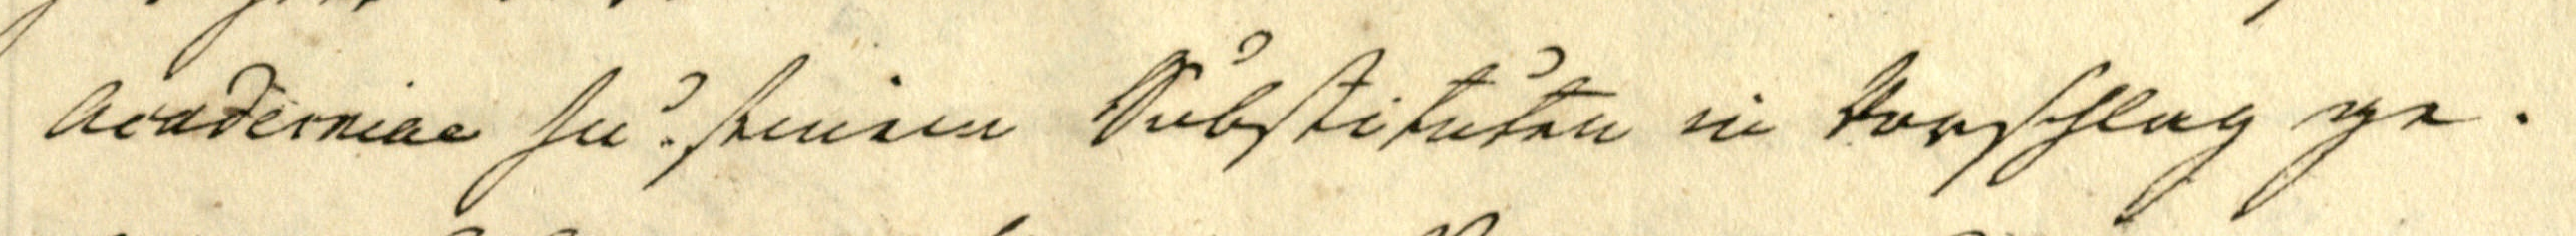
Academiae zu seinem Substituten in Vorschlag ge¬
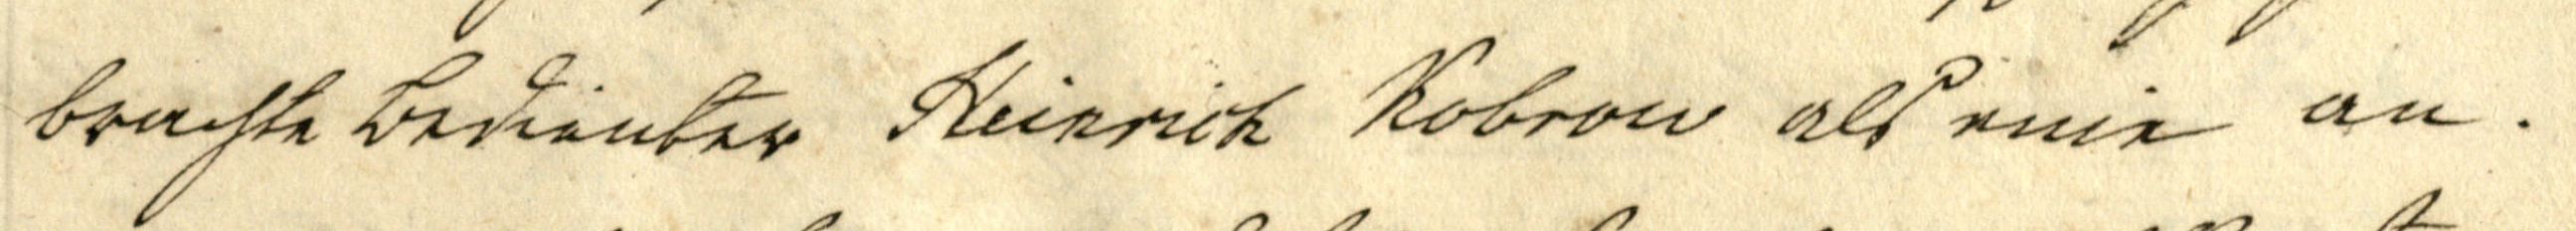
brachte Bedienter Heinrich Kobrow als eine an¬
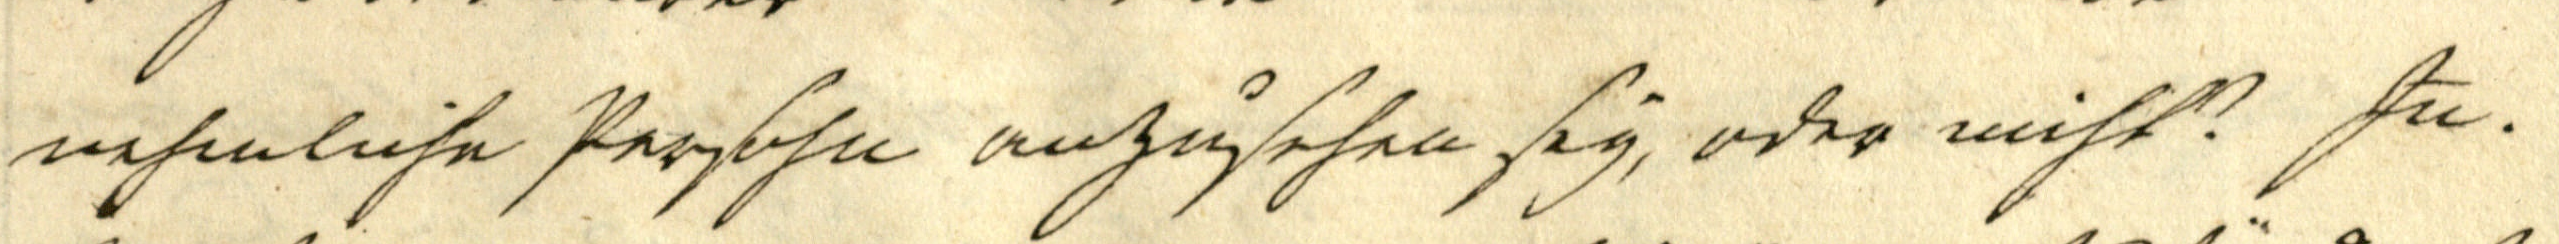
nehmliche Persohn anzusehen seÿ, oder nicht. In¬
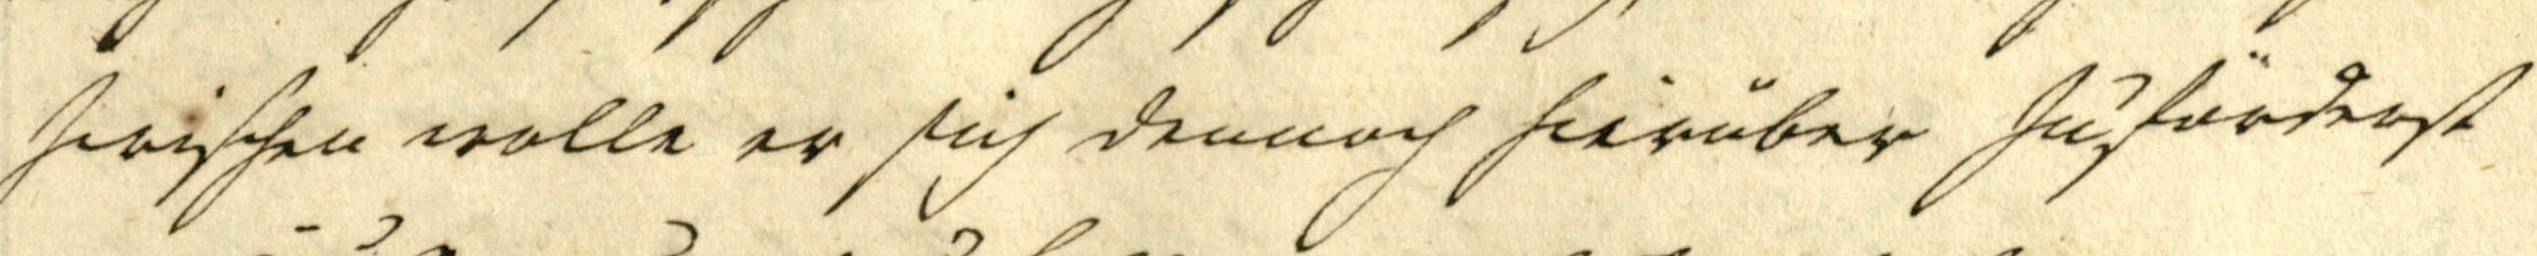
zwischen wolle er sich dennoch hierüber zuförderst
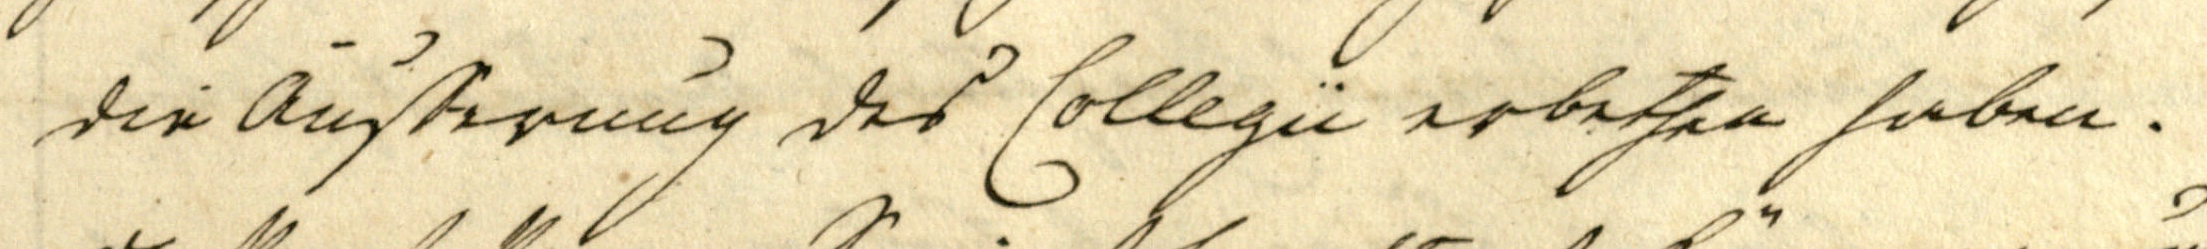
die Äusserung des Collegii erbethen haben.
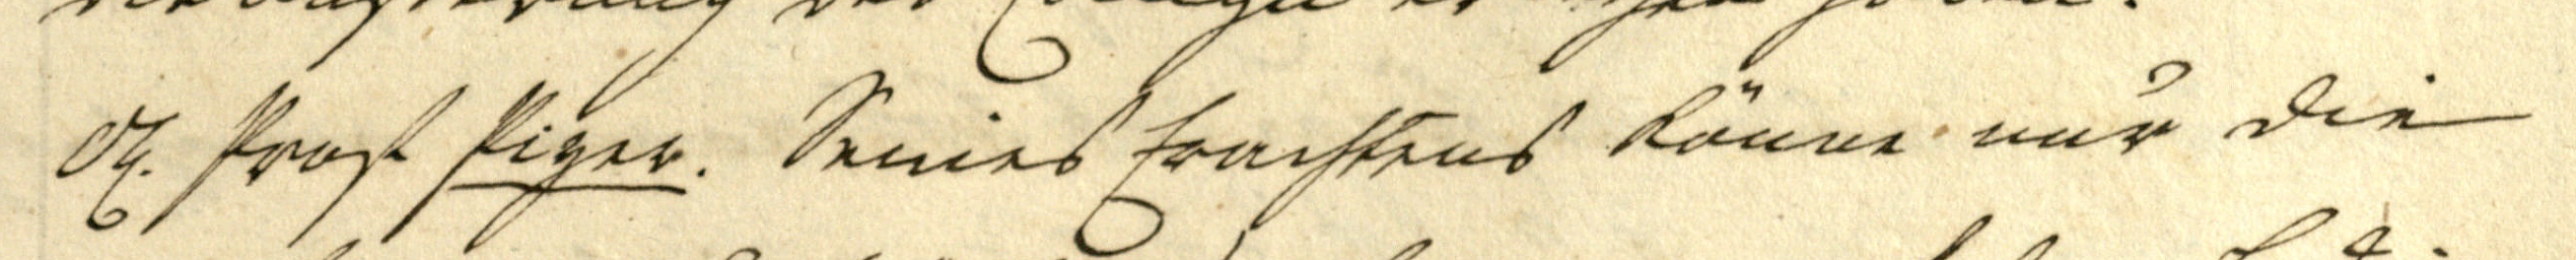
dh. Prof. Piper. Seines Erachtens könne nur die
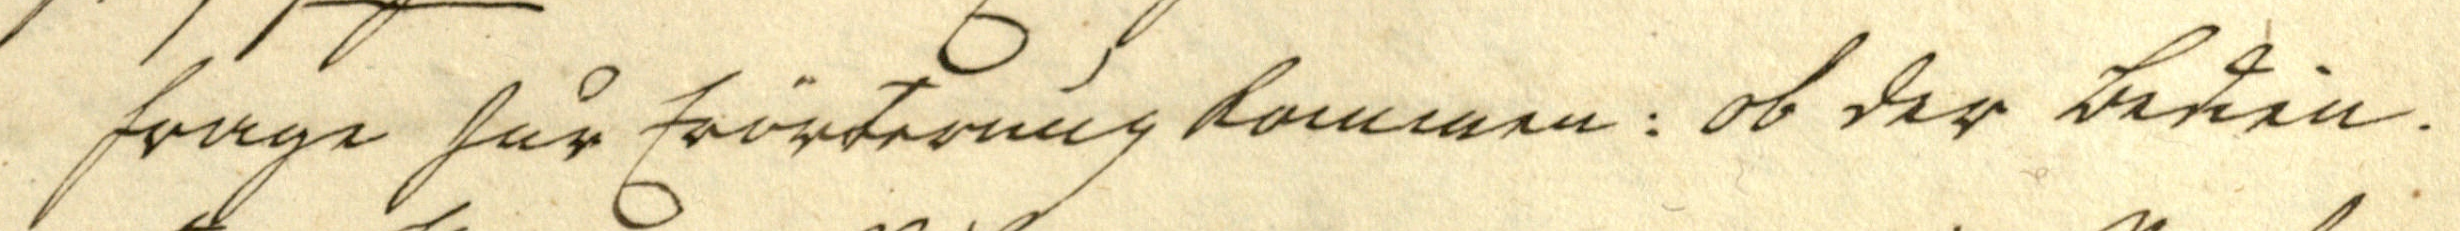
frage zur Erörterung kommen: ob der Bedien¬
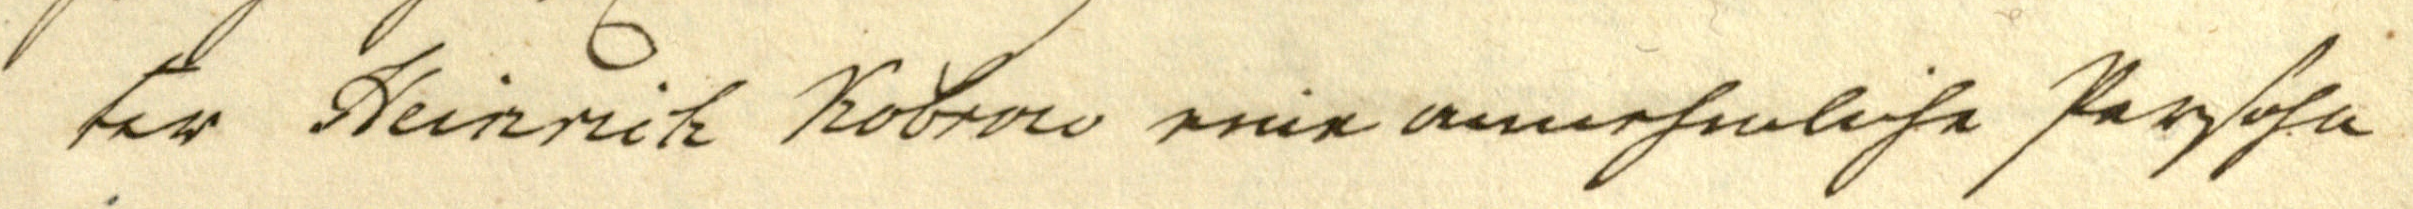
ter Heinrich Kobrow eine annehmliche Persohn
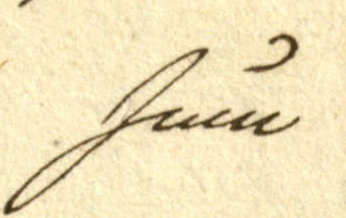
zum
